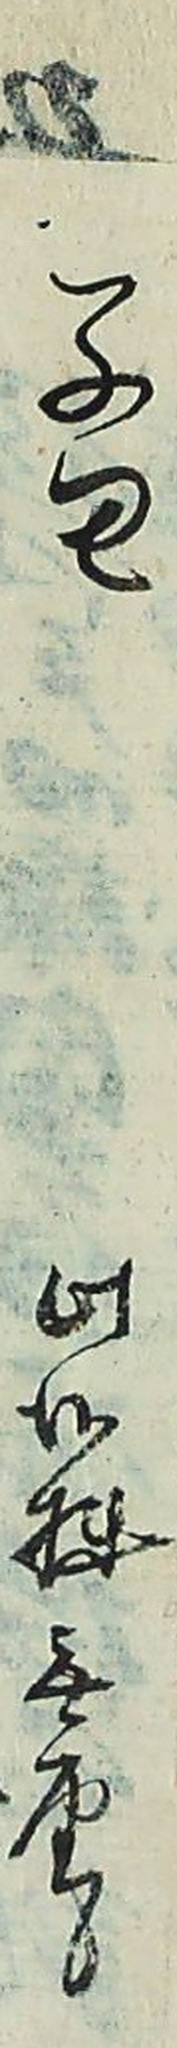子丑此御株無御座候
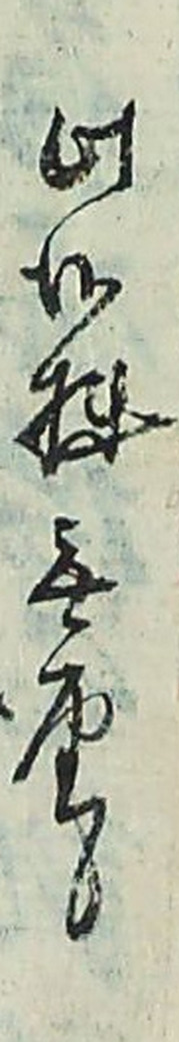卯此御株無御座候
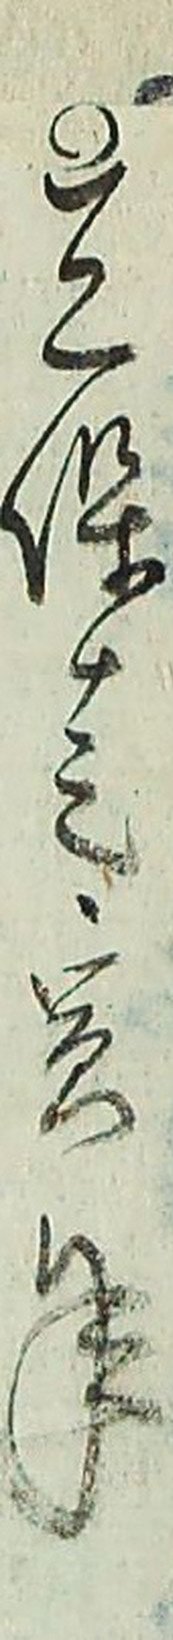○天保十三寅年
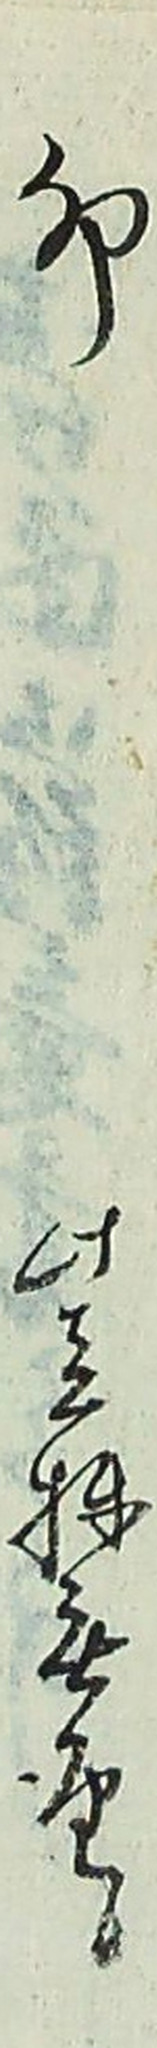卯此御株無御座候
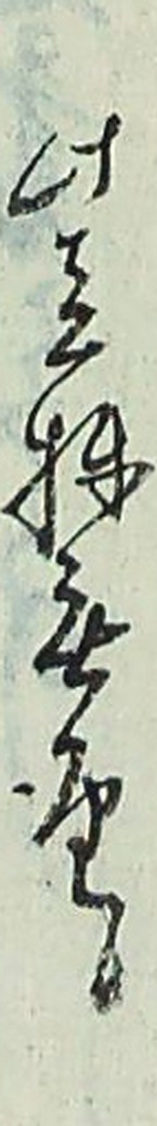卯此御株無御座候
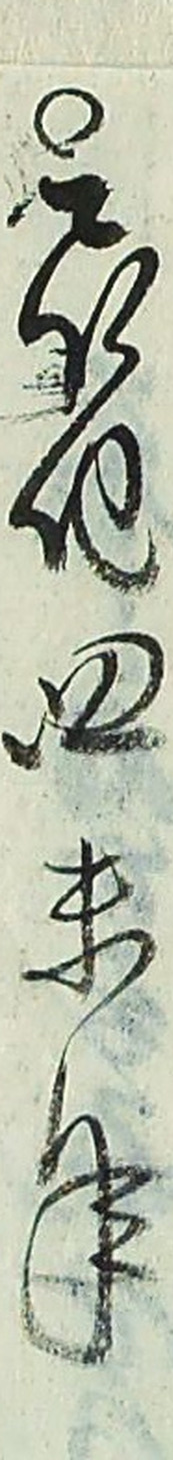○弘化四未年

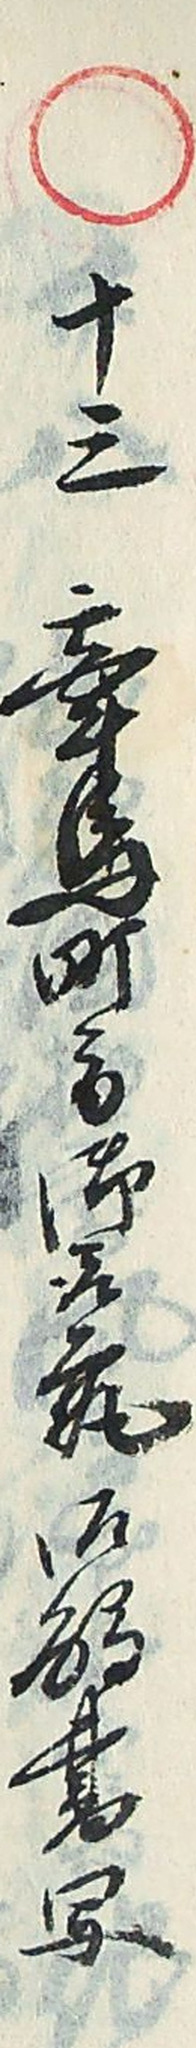朱丸十三牽馬町方御取究御觸書写
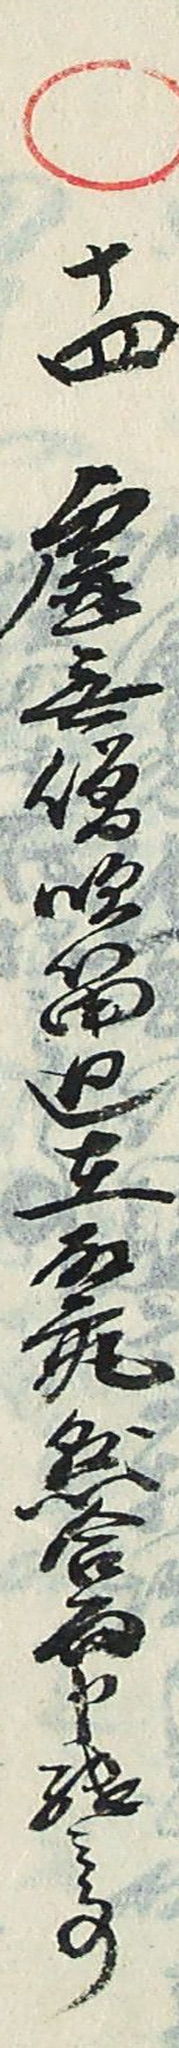朱丸十四虚無僧吹笛廻在取究懸合而申継之事
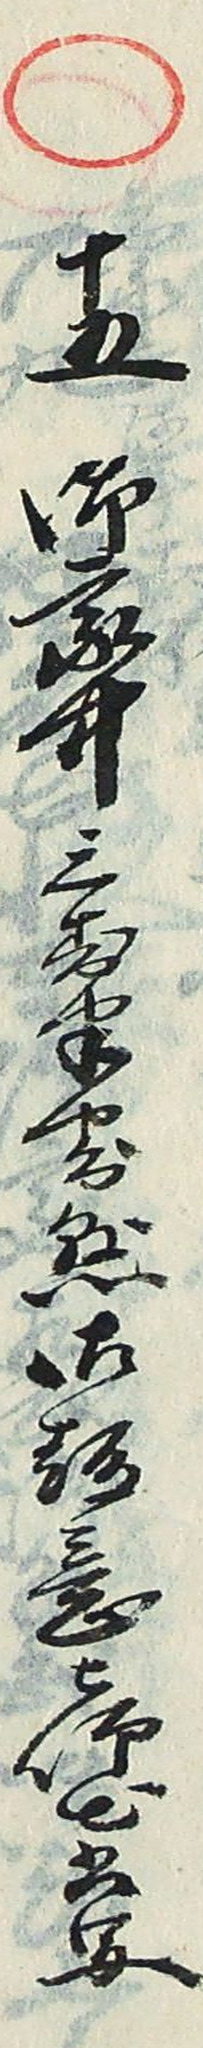朱丸十五御家中三歩半歩懸御趣意被仰出書写
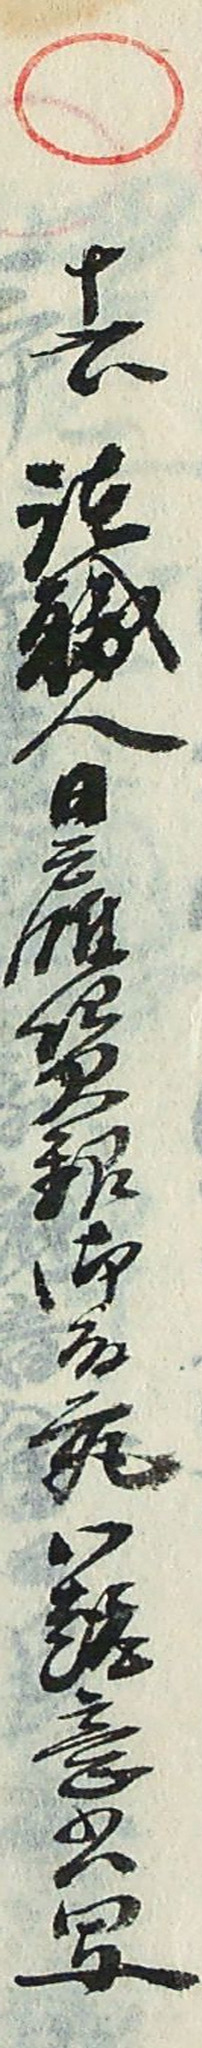朱丸十六諸職人日雇賃銀御取究御趣意書写
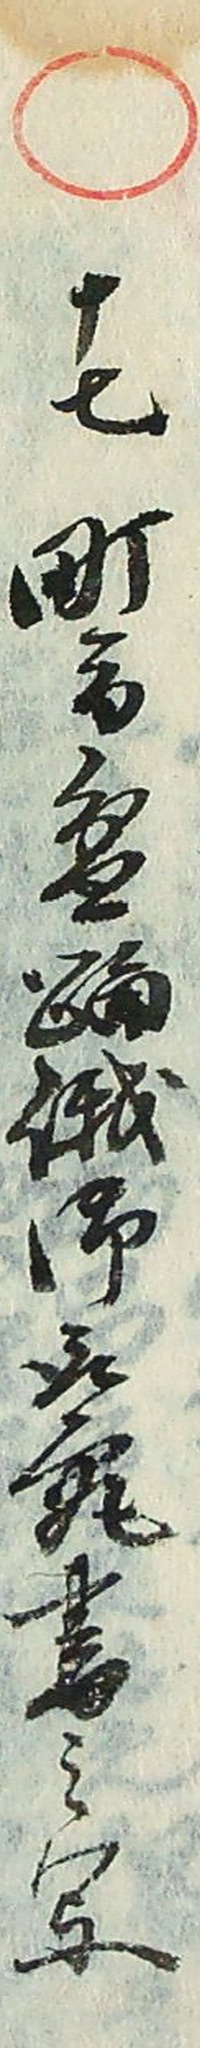朱丸十七町方盆踊俄御取究書之写
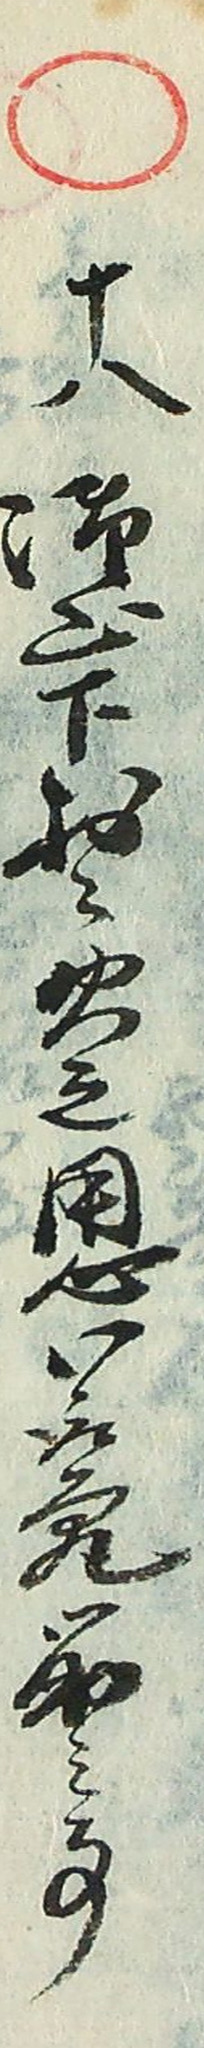朱丸十八御山下村々火之用心御取究筋之事
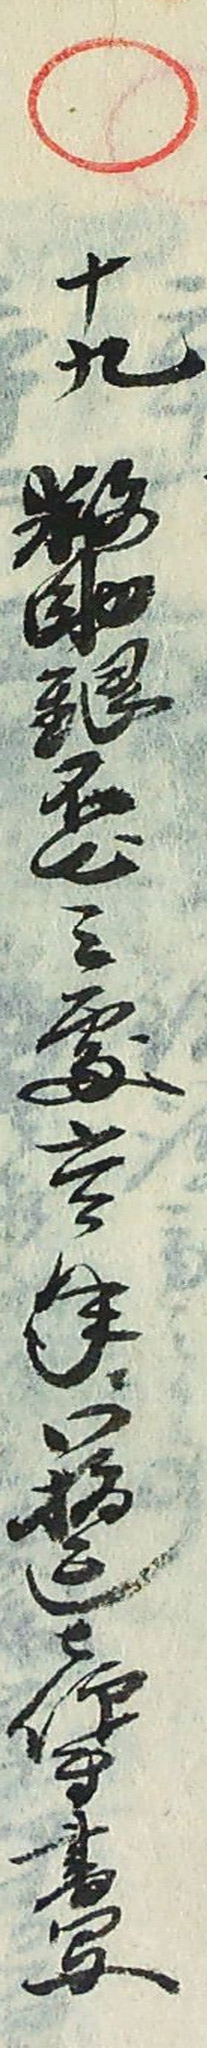朱丸十九救助銀不出之處六ケ年ニ御指延被仰付書写
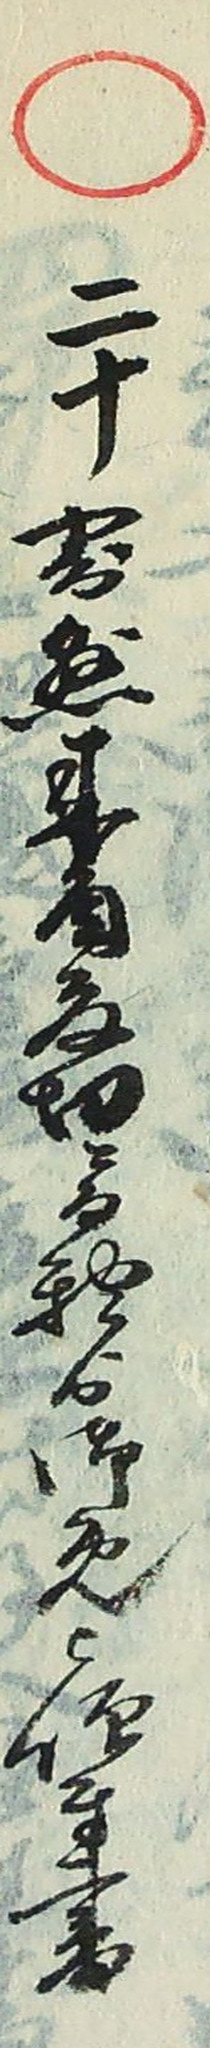朱丸二十歩懸来酉夏切ニ而秋ゟ御免被仰付書
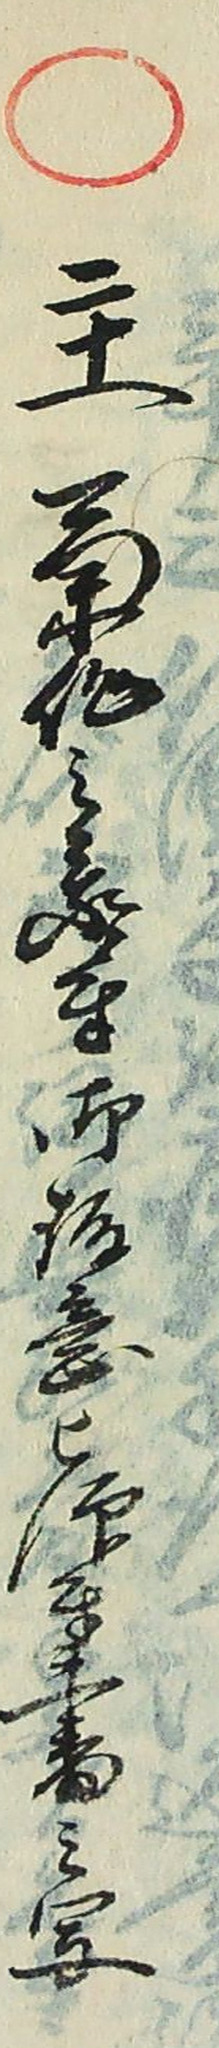朱丸二十一菊作之義ニ付御趣意被仰付書之写
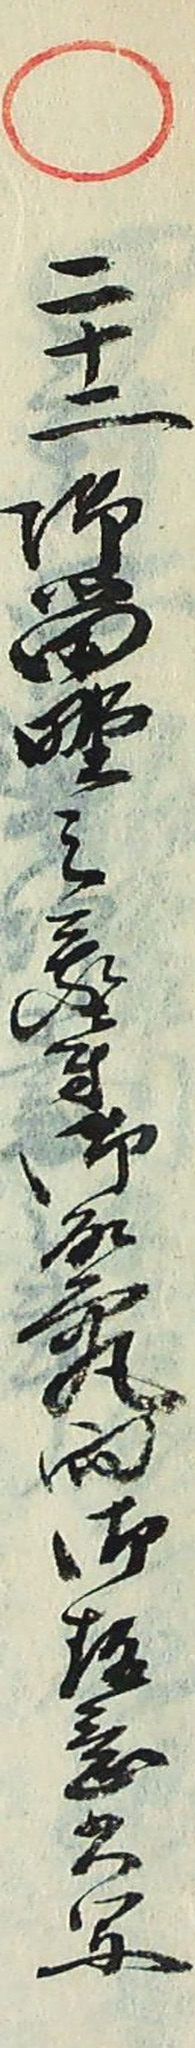朱丸二十二御留野之義ニ付御取究向御趣意書写
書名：諸御趣意書并御下知向之写
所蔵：鳴門教育大学 Naruto University of Education
